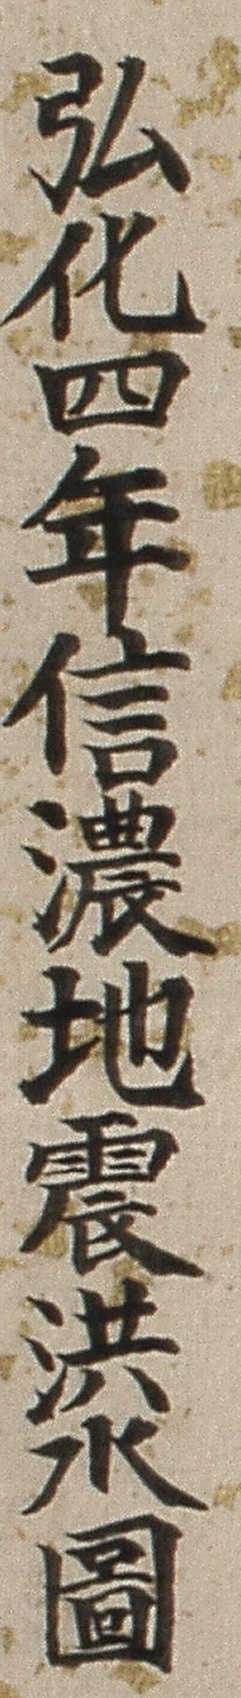弘化四年信濃地震洪水図

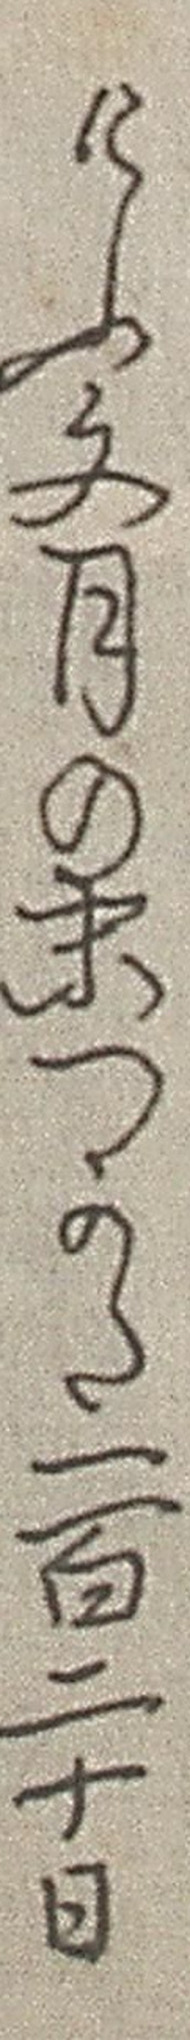けふ文月の末つかた一百二十日
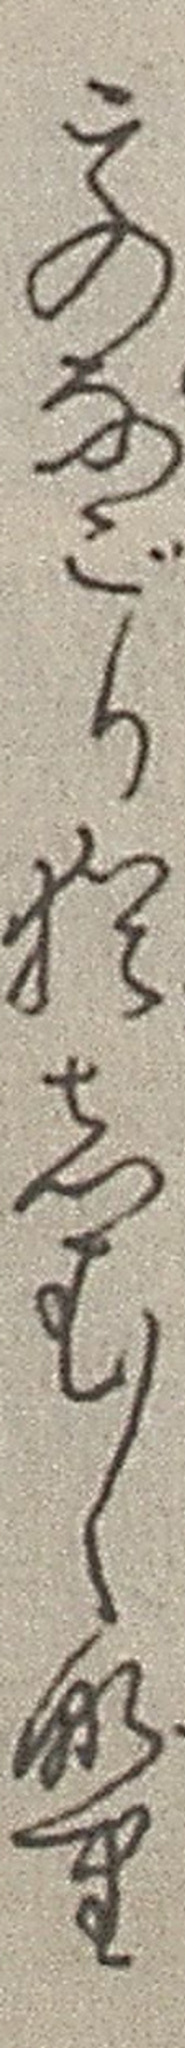そのなごり猶しむ〳〵なり
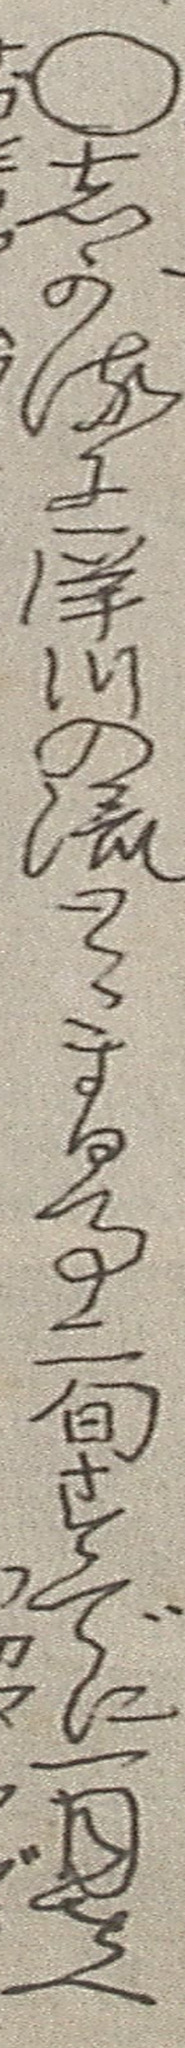しかるに犀川の流とゞまる事二旬すでに一月をへ
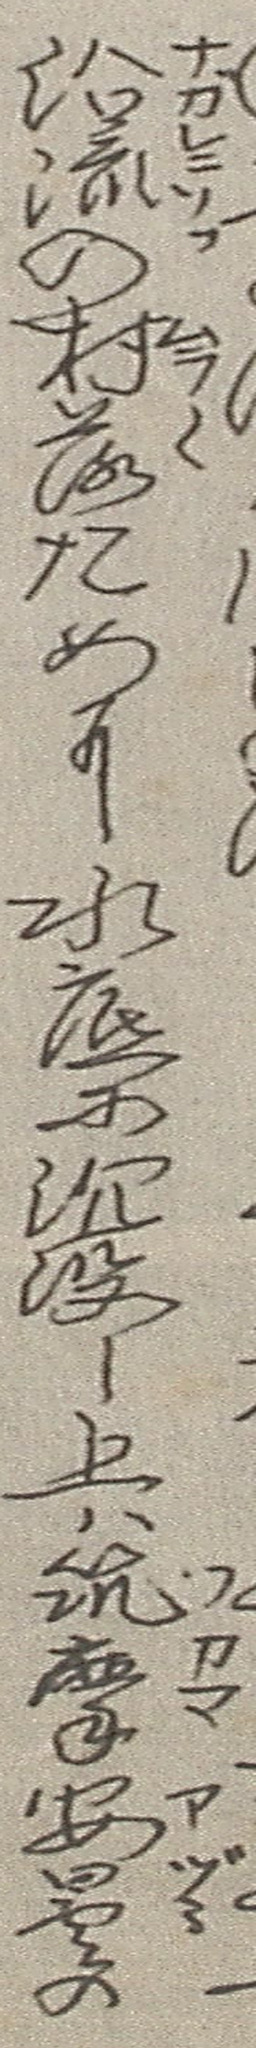沿流の村落ために水底に沈没し上は筑摩安曇の
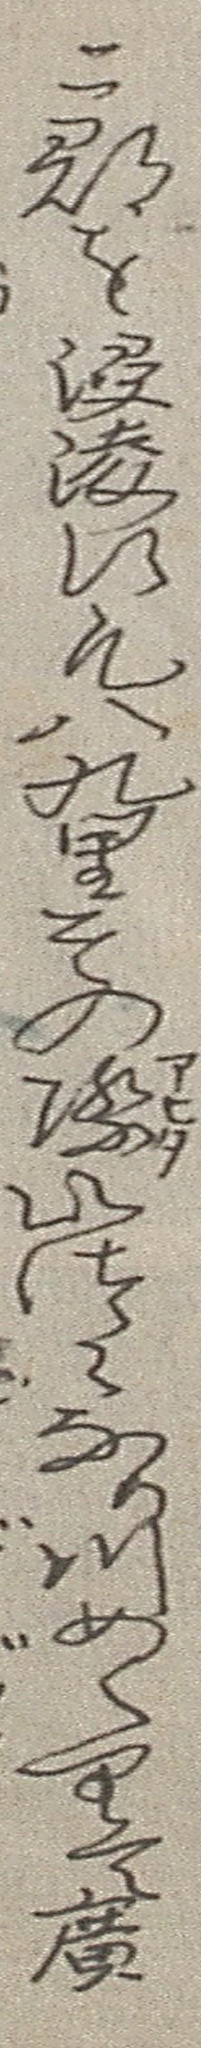二郡を浸凌す凡八九里その際山つらなり川めくりて廣
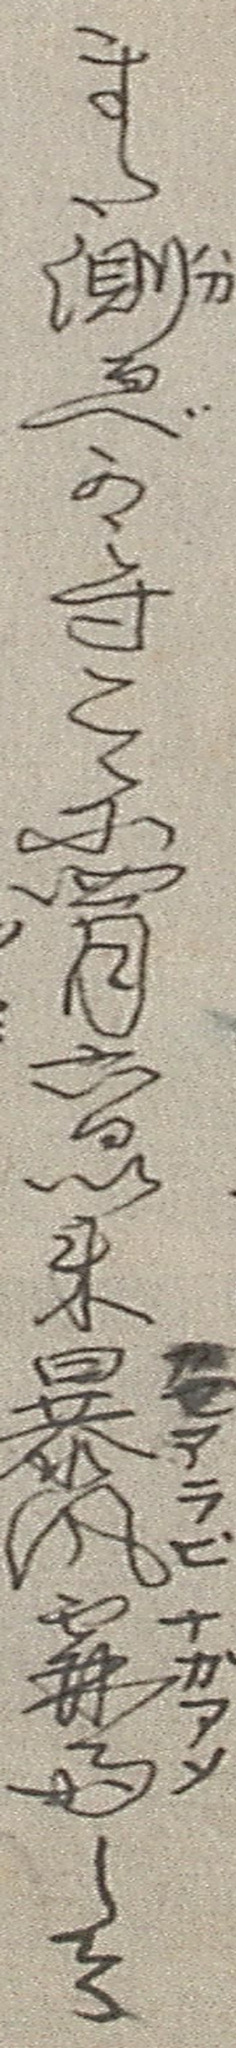また測るべからすこゝに四月六日以来暴風霖雨して
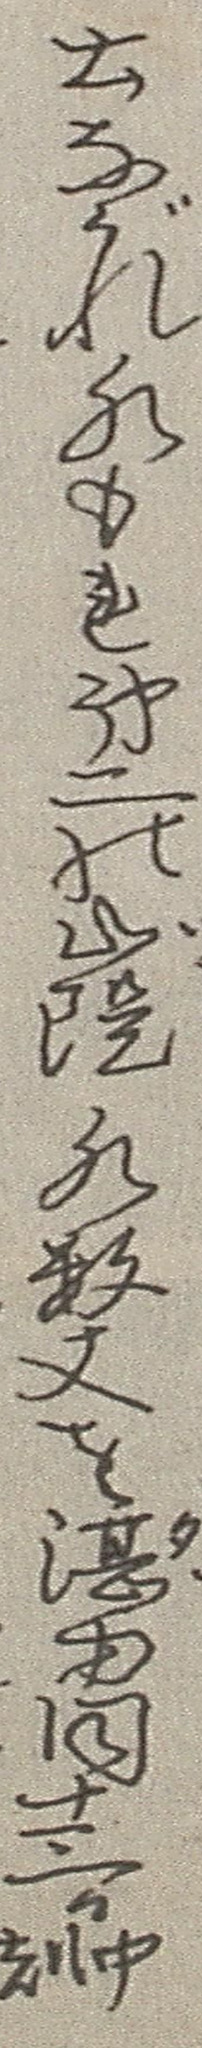土ながれ水もれ第二の山隄水数丈を湛ゆ同十三日中刻
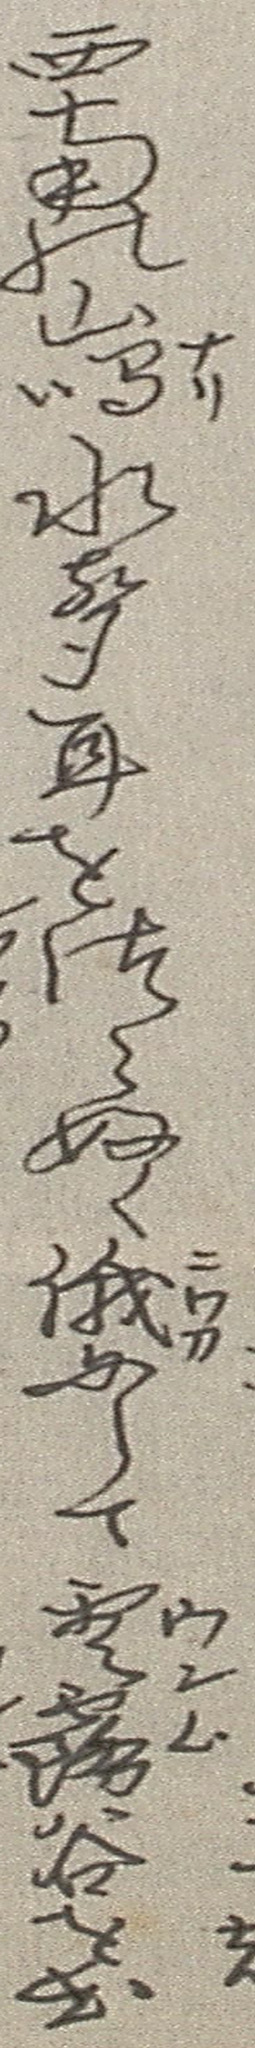西南の山鳴水声耳をつらぬく俄にして雲霧谷を出
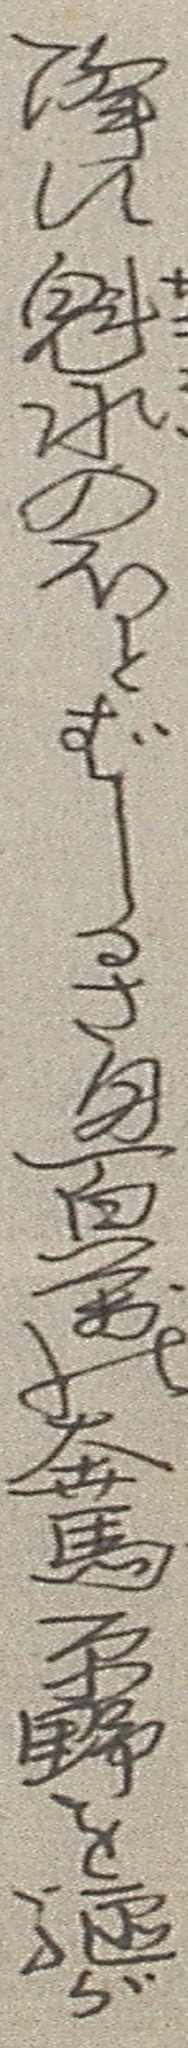降す魁水のほとばしるさま百万の奔馬原野を駆が
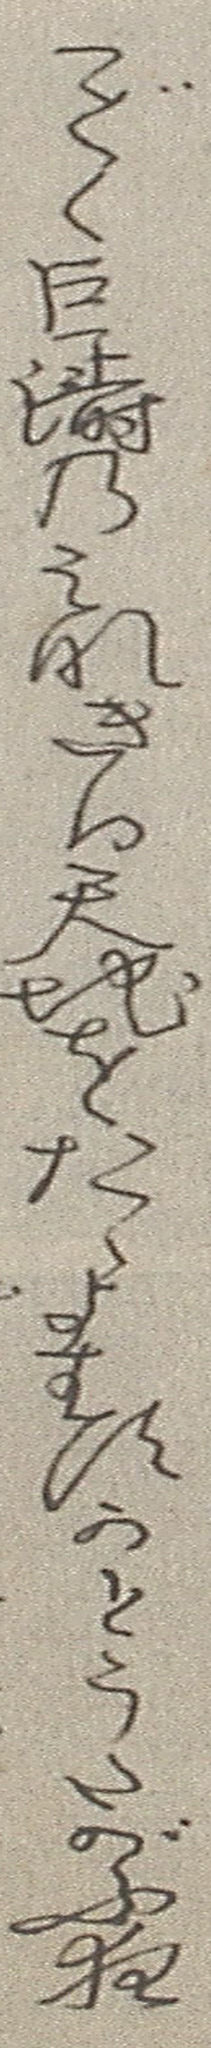ごとく巨涛のみなきる天地をたゝよはすかとうたがふ夜
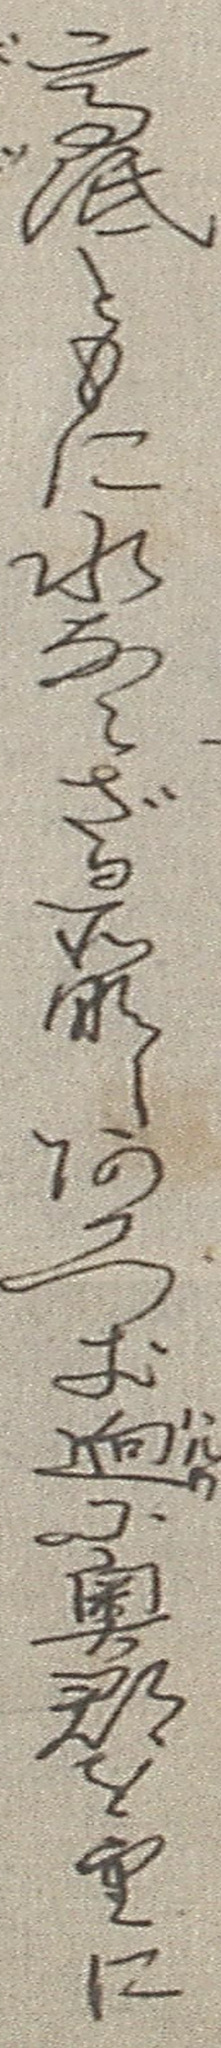高低ともに水ならざる所なしあかつき逈に奥郡を望に
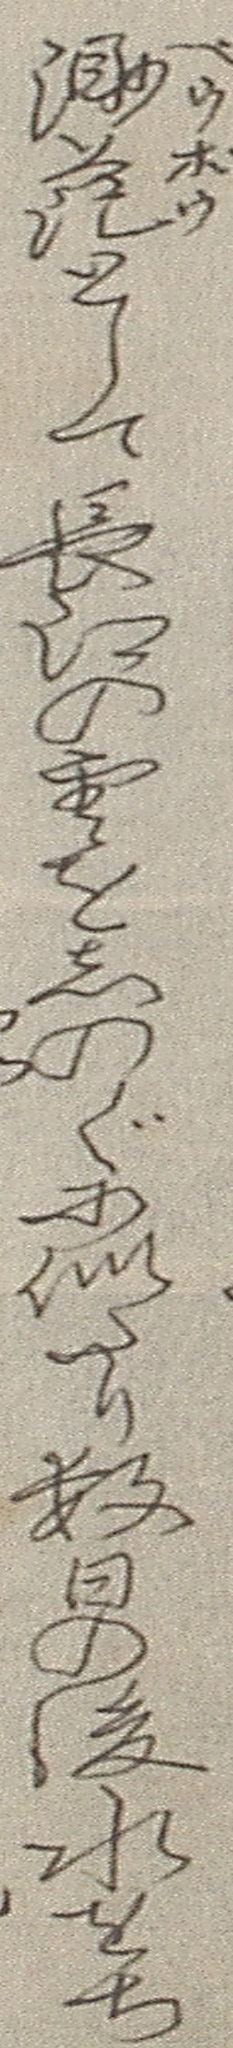渺茫として長江の雲をしのぐに似たり数日の後水をち
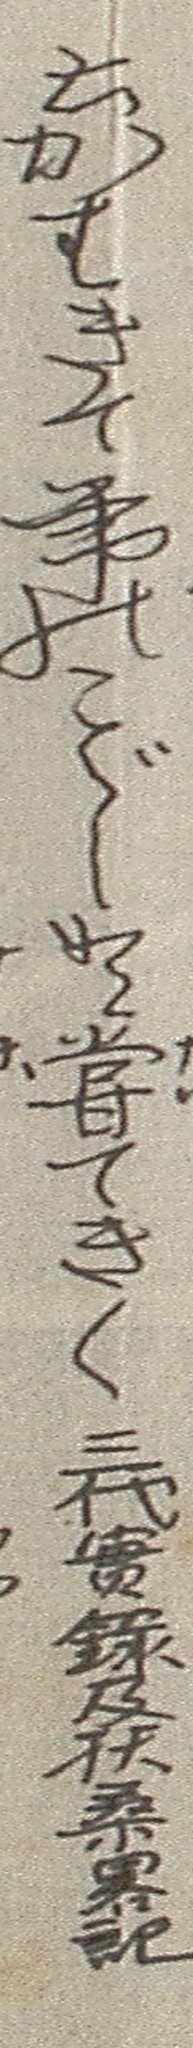土かはきて筆のことしと甞てきく三代実録及扶桑畧記
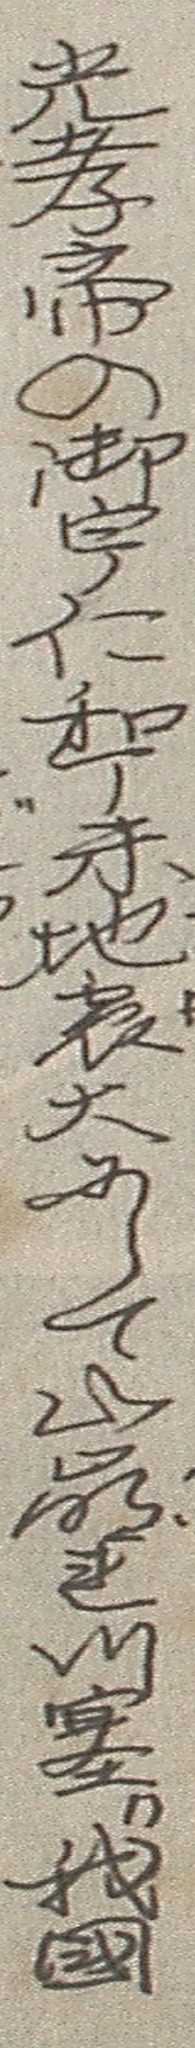光孝帝の御宇仁和丁未地震大にして山崩れ川塞く我国
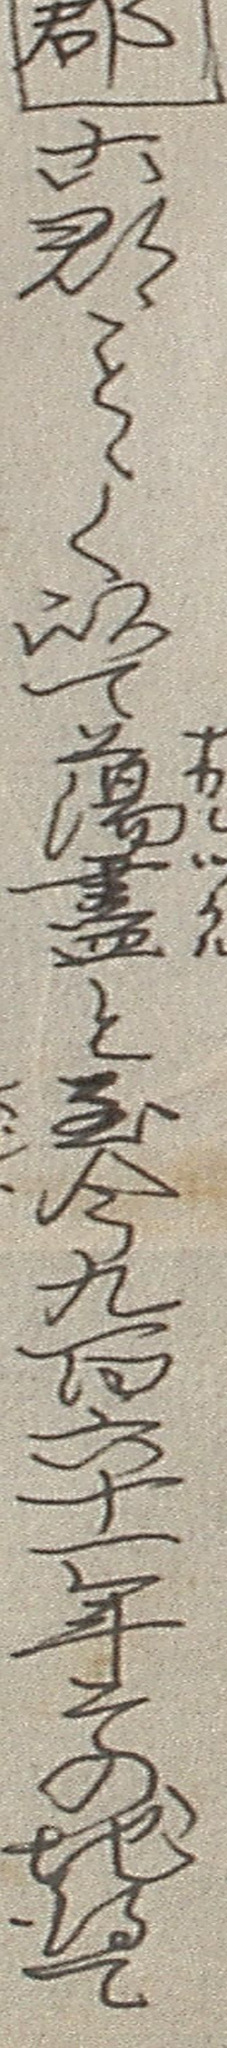六郡こと〳〵く以て蕩盡と至今九百六十一年その地得て
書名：弘化四年信濃地震洪水圖
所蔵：東京大学地震研究所図書室 Earthquake Research Institute Library, The University of Tokyo, JAPAN
